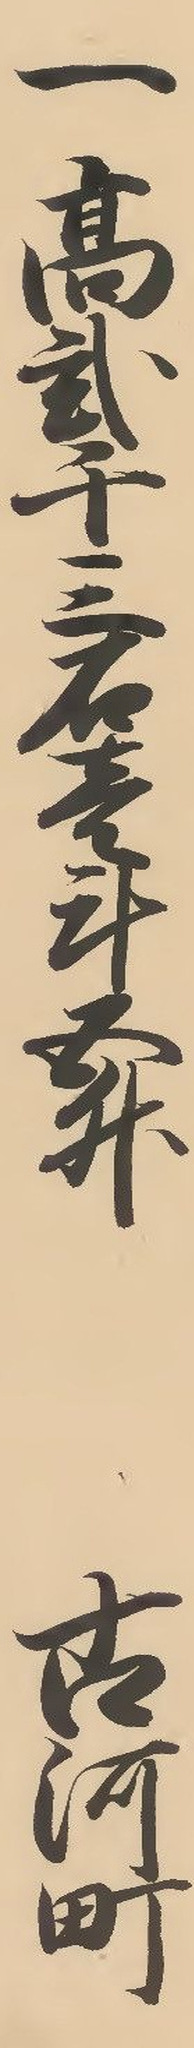一高弐千三石壱斗五升古河町
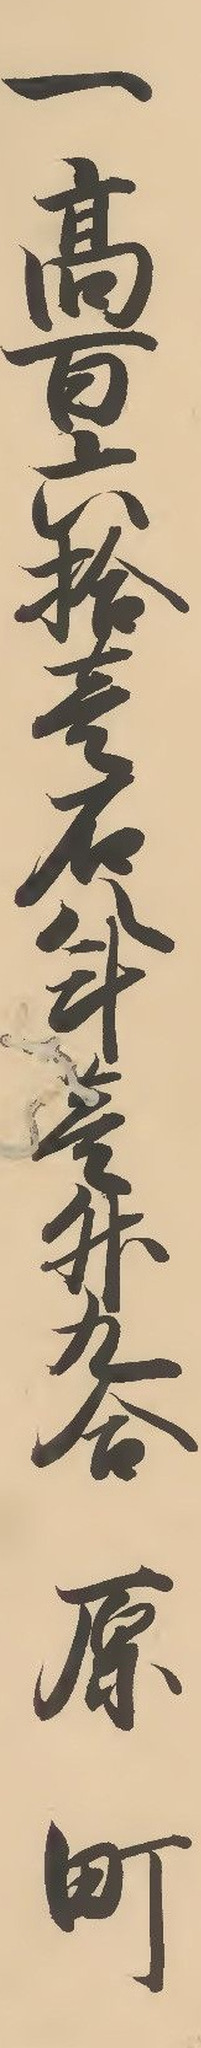一高百六拾壱石八斗壱升九合原町

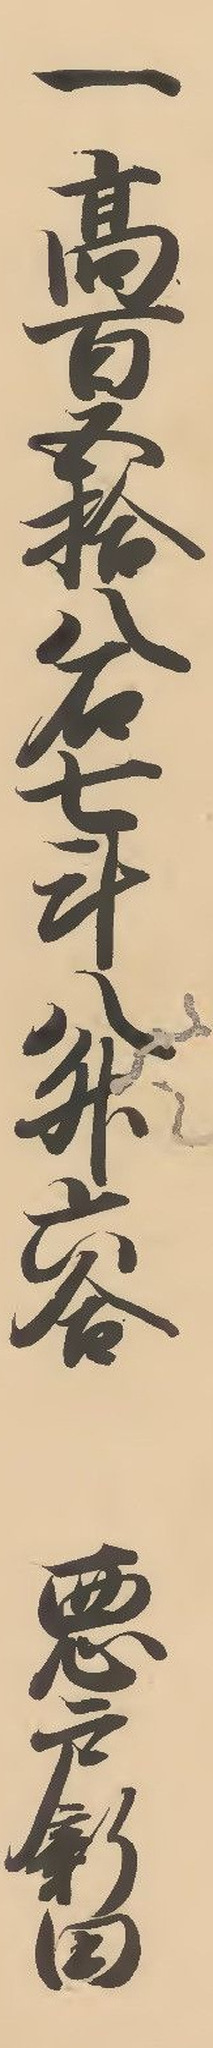一高百五拾八石七斗八升六合悪戸新田
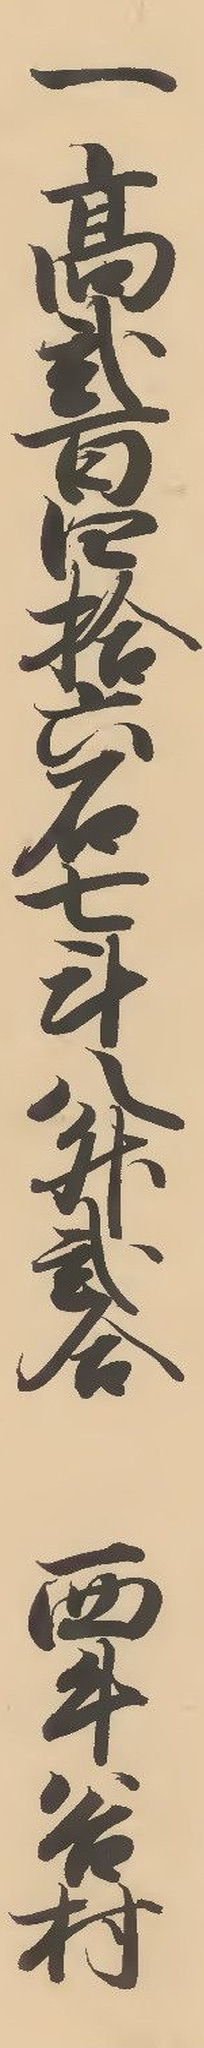一高弐百四拾六石七斗八升弐合西牛谷村
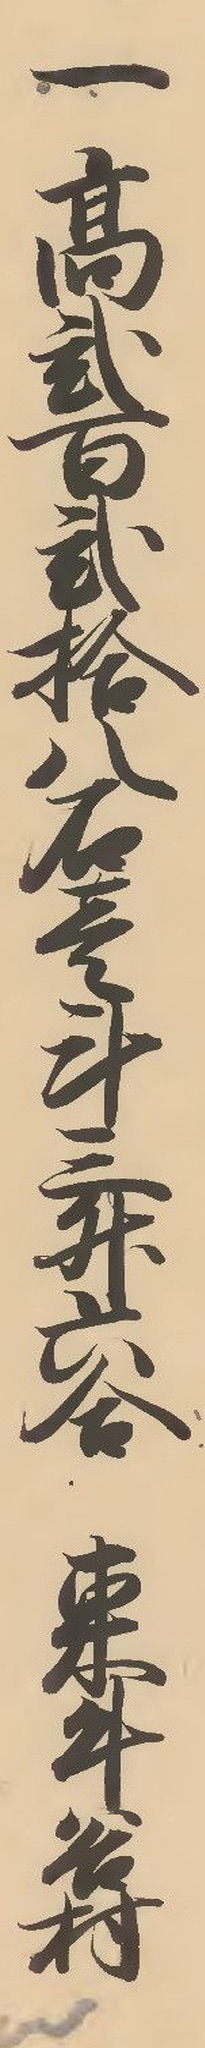一高弐百弐拾八石壱斗三升六合東牛谷村
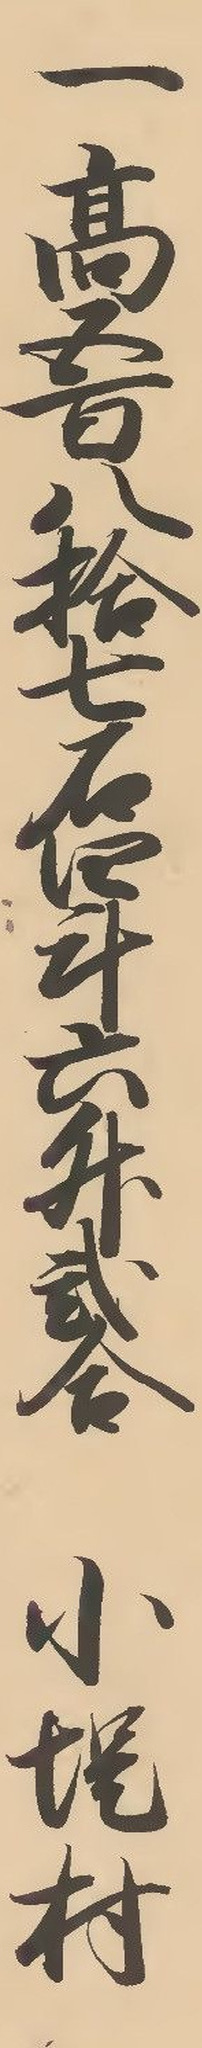一高五百八拾七石四斗六升弐合小堤村
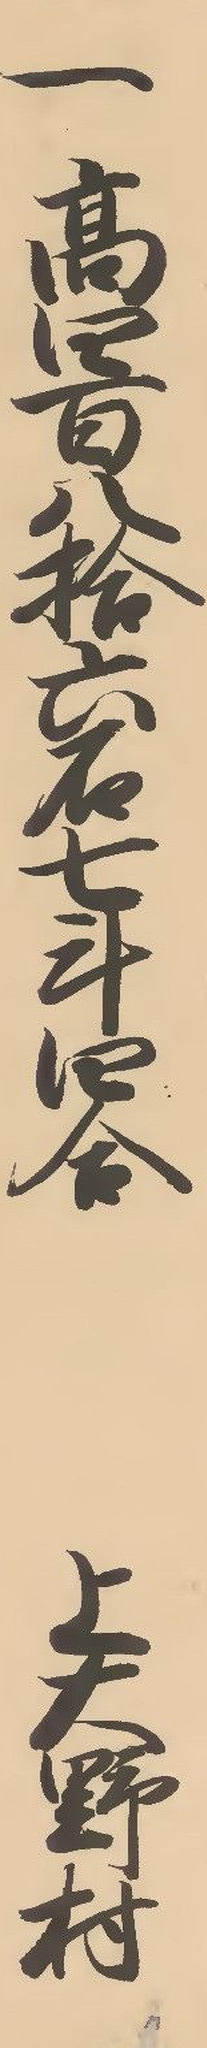一高四百八拾六石七斗四合上大野村
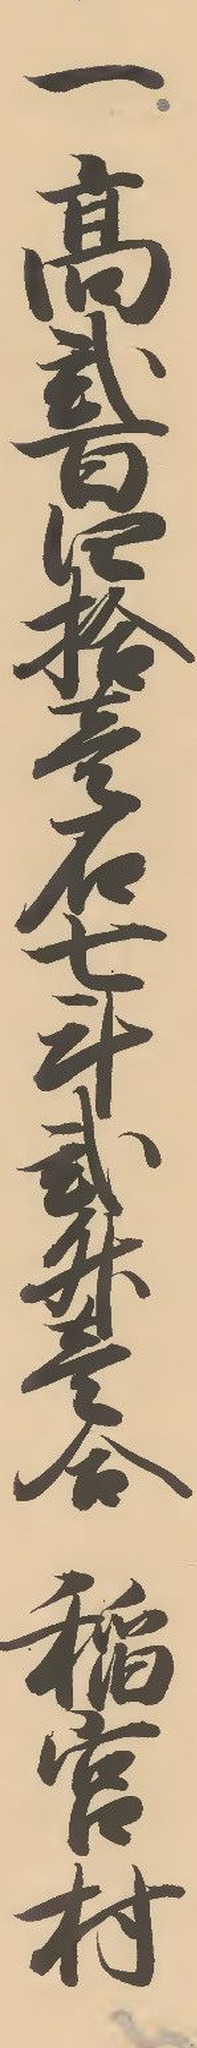一高弐百四拾壱石七斗弐升壱合稲宮村
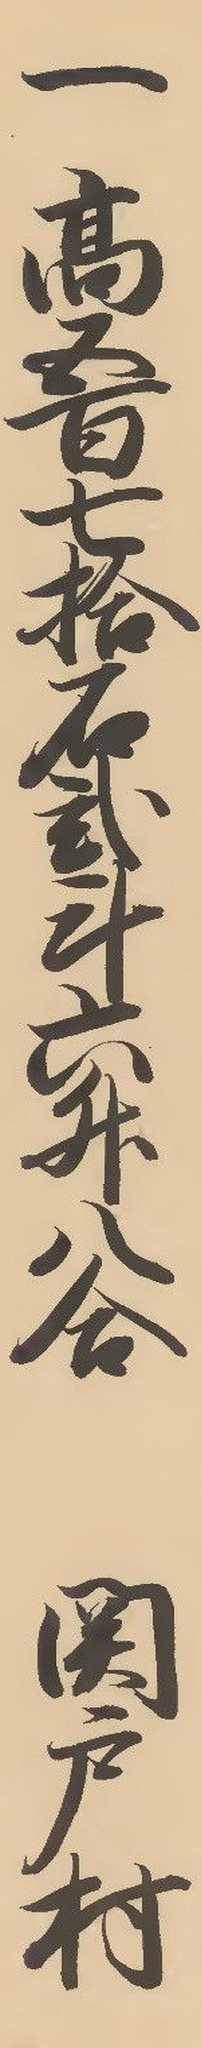一高五百七拾石弐斗六升八合関戸村
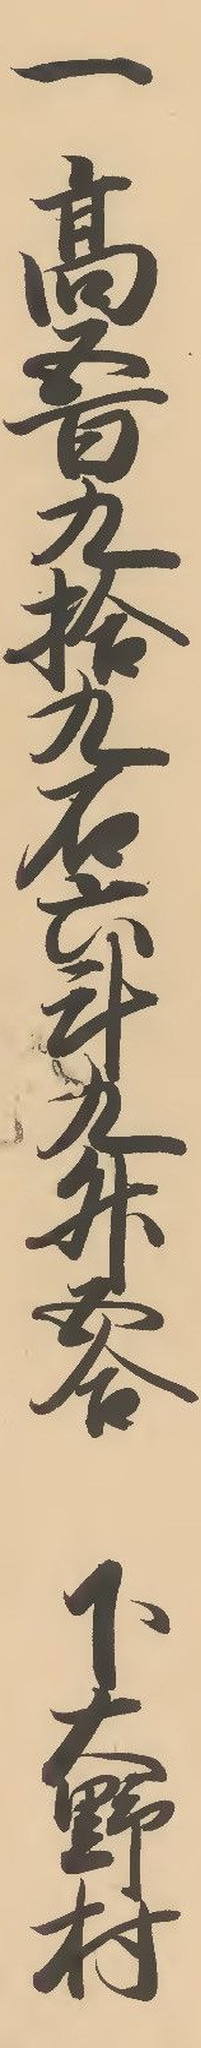一高五百九拾九石六斗九升五合下大野村

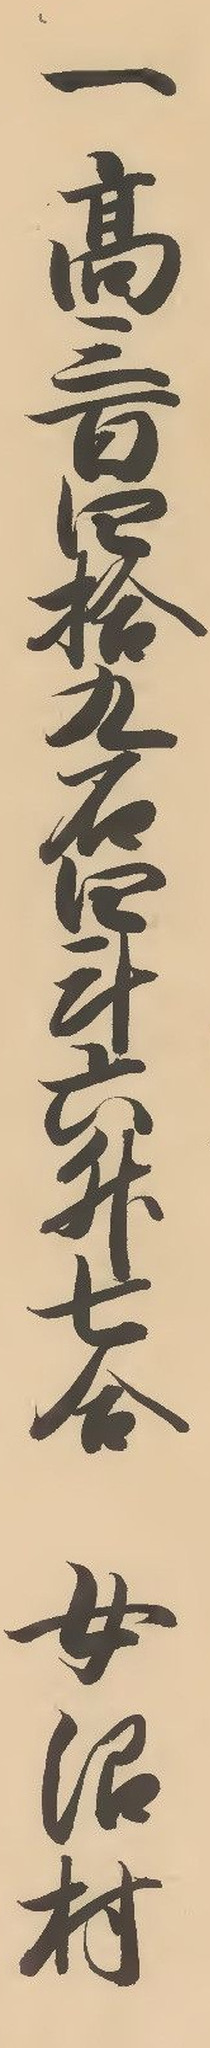一高三百四拾九石四斗六升七合女沼村
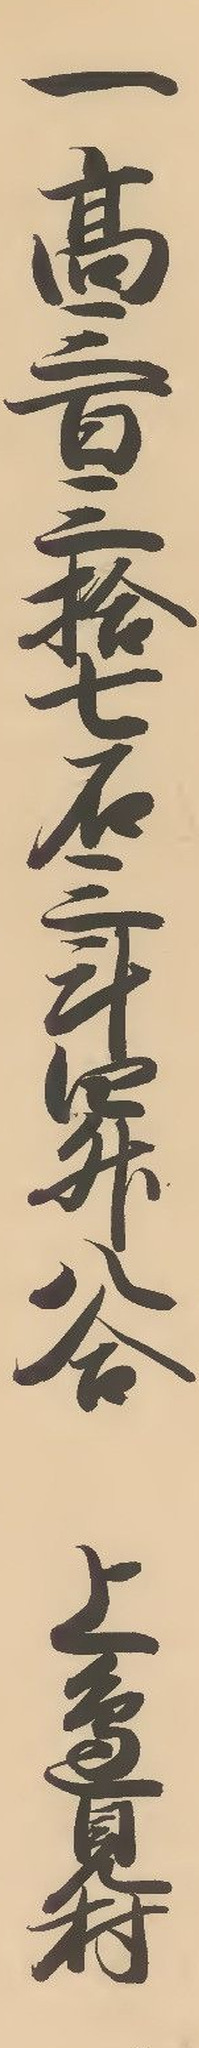一高三百三拾七石三斗四升八合上辺見村
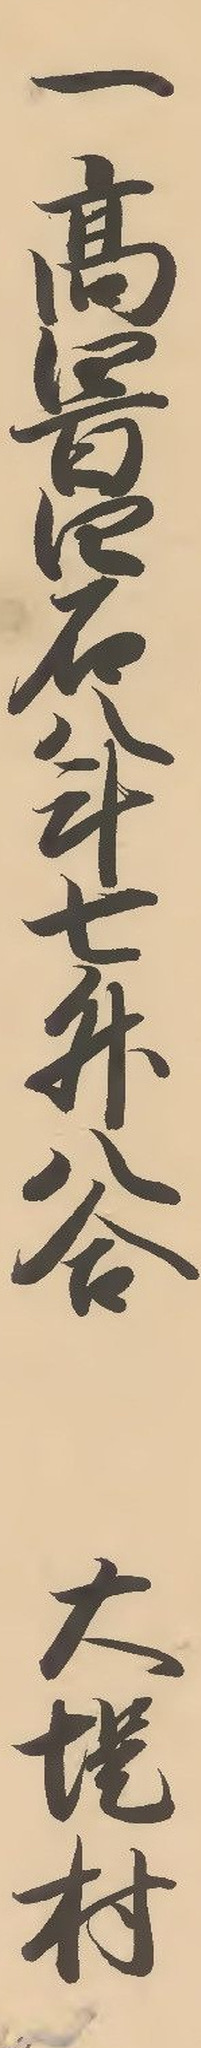一高四百四石八斗七升八合大堤村
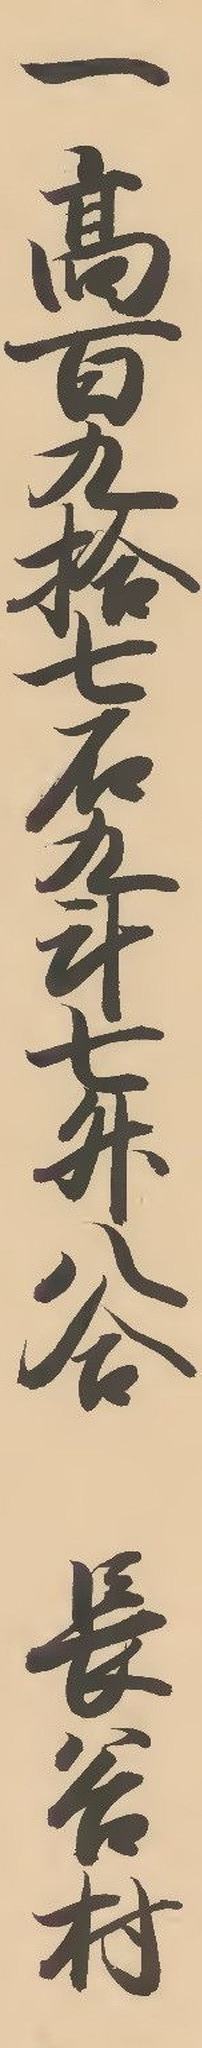一高百九拾七石九斗七升八合長谷村
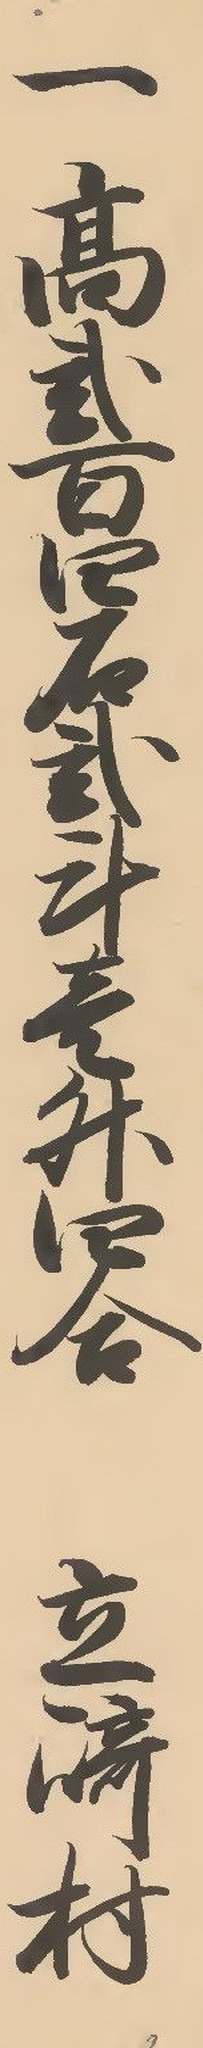一高弐百四石弐斗壱升四合立崎村
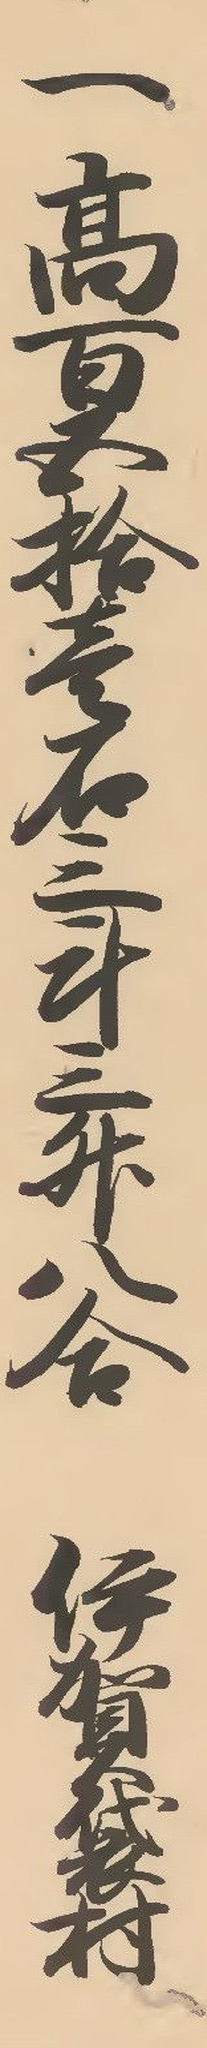一高百五拾壱石三斗三升八合伊賀袋村
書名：下総国郷帳
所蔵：国立公文書館 National Archives of Japan
